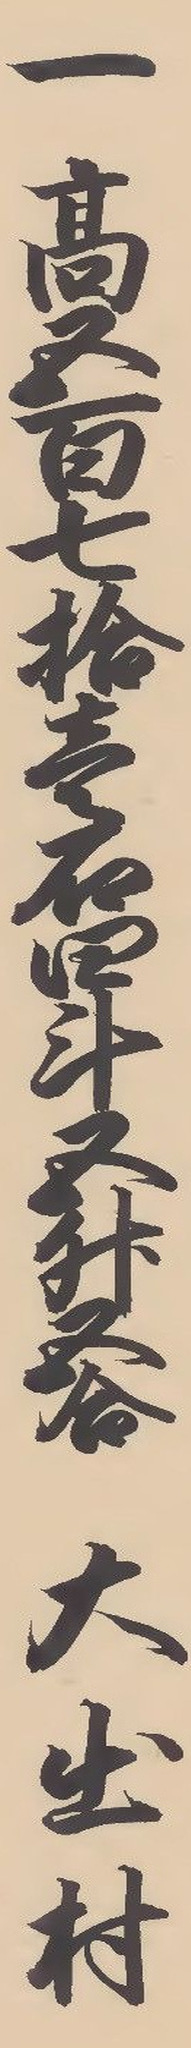一高五百七拾壱石四斗五升五合大出村
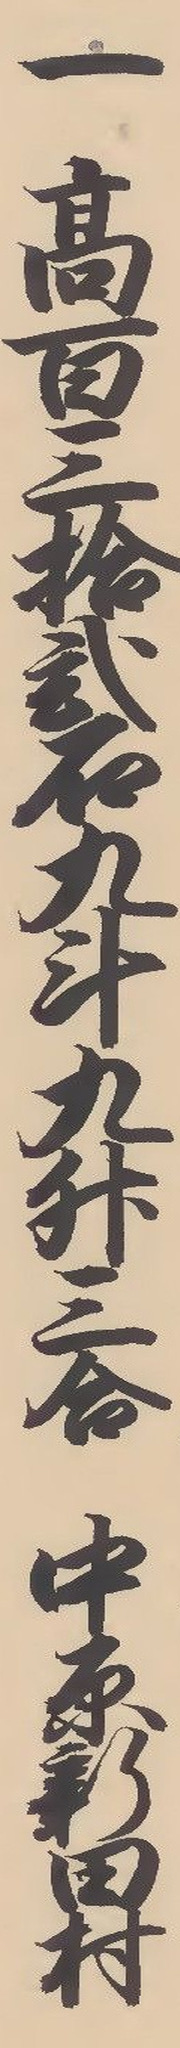一高百三拾弐石九斗九升三合中原新田村
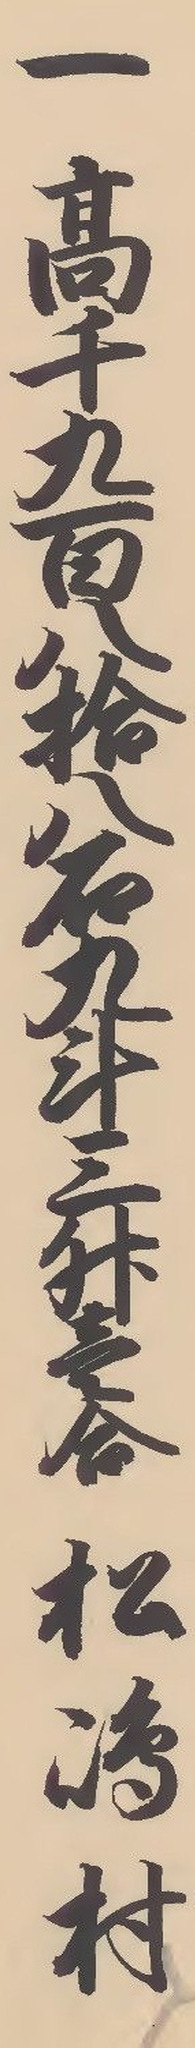一高千九百八拾八石九斗三升壱合松島村

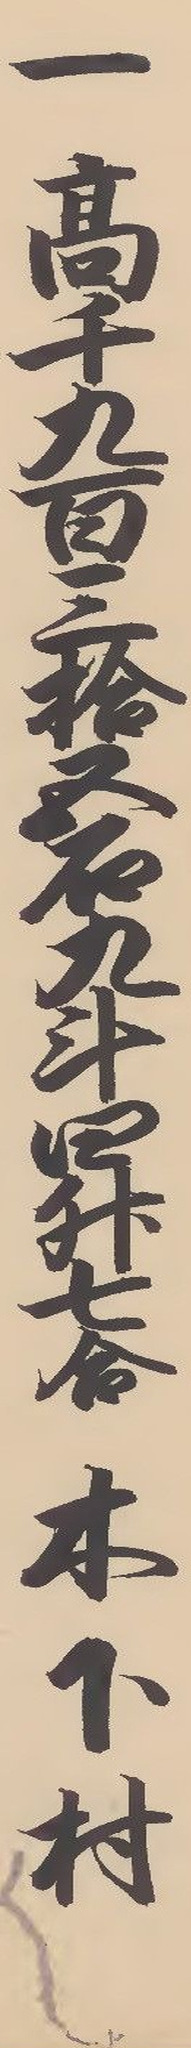一高千九百三拾五石九斗四升七合木下村
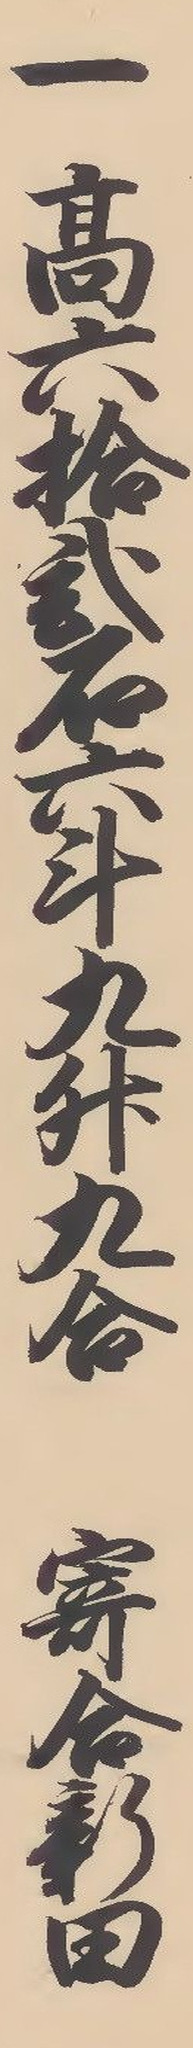一高六拾弐石六斗九升九合寄合新田
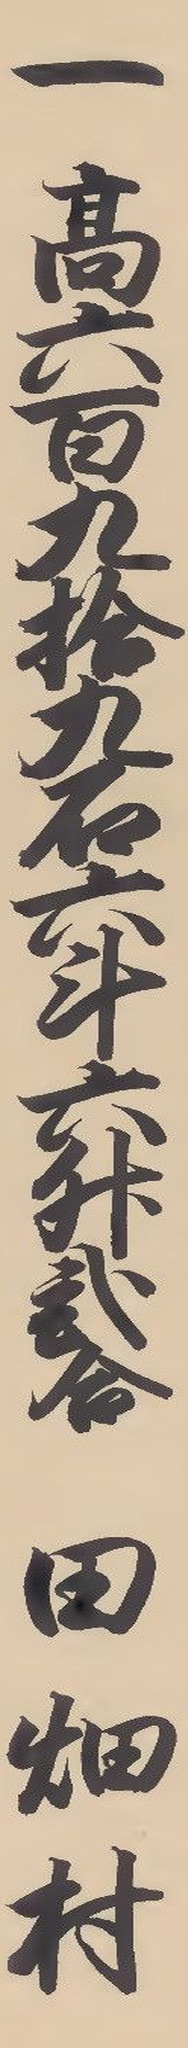一高六百九拾九石六斗六升弐合田畑村
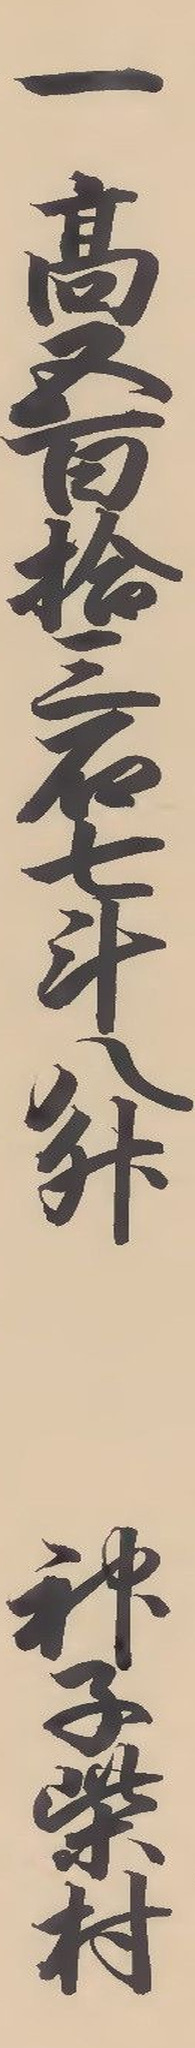一高五百拾三石七斗八升神子柴村
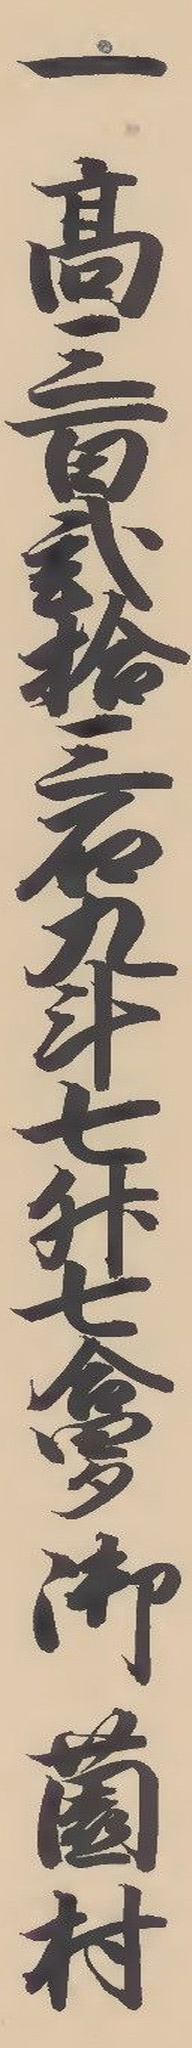一高三百弐拾三石九斗七升七合四勺御園村
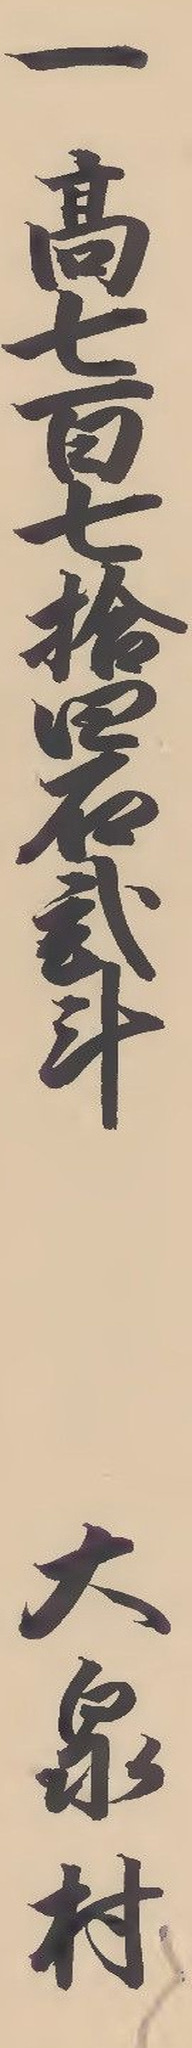一高七百七拾四石弐斗大泉村

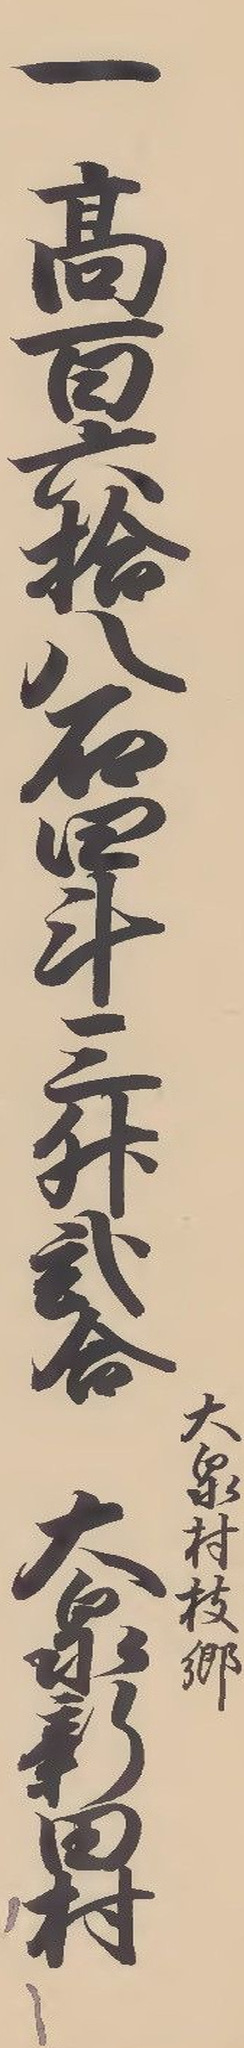一高百六拾八石四斗三升弐合大泉新田村
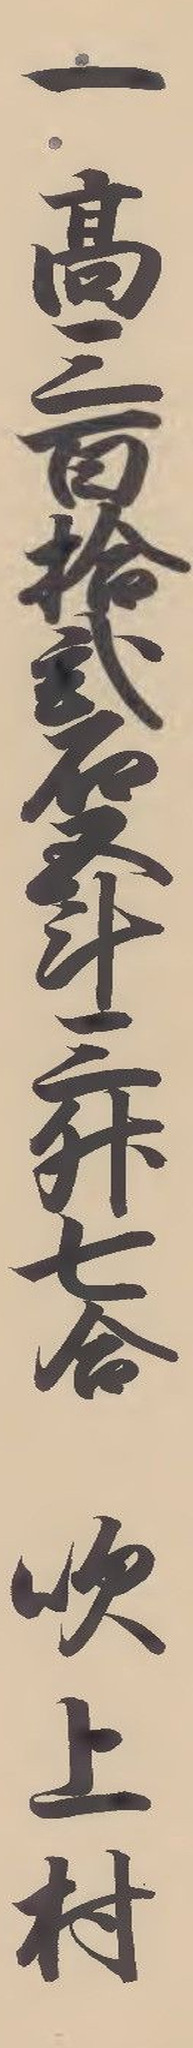一高三百拾弐石五斗三升七合吹上村
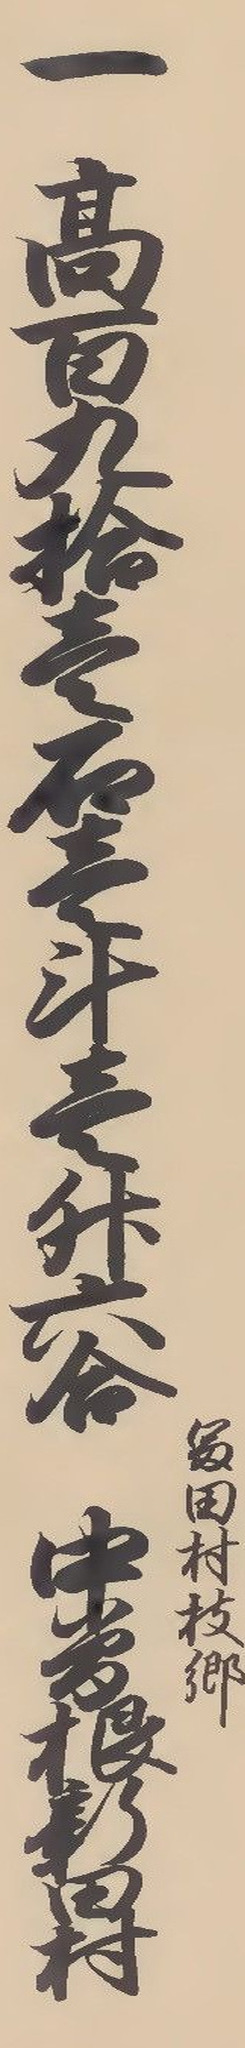一高百九拾壱石壱斗壱升六合中曽根新田村
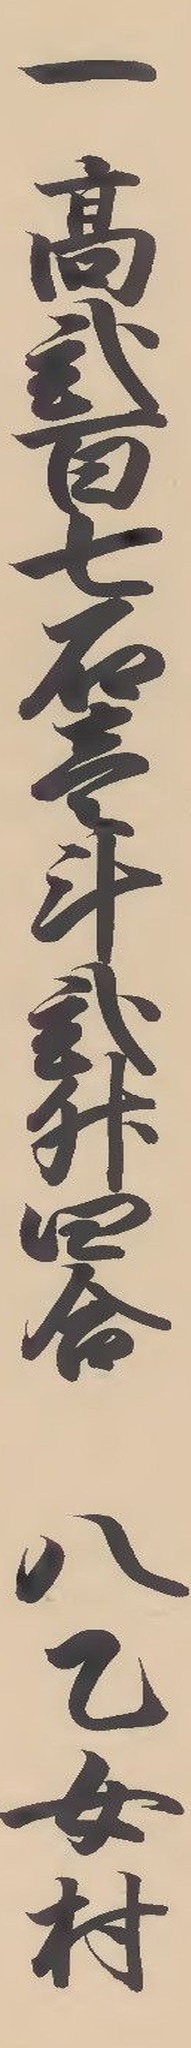一高弐百七石壱斗弐升四合八乙女村
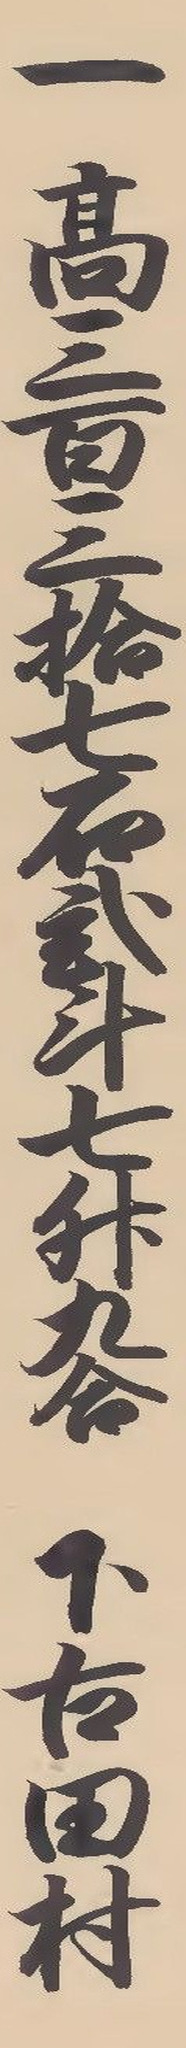一高三百三拾七石弐斗七升九合下古田村
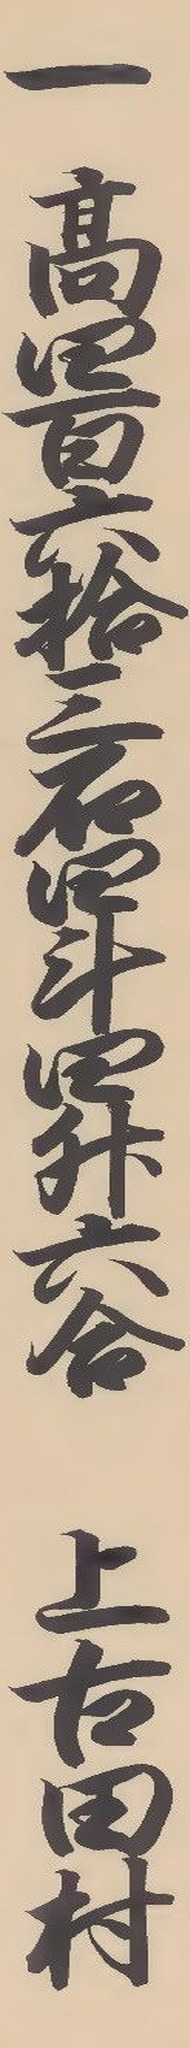一高四百六拾三石四斗四升六合上古田村
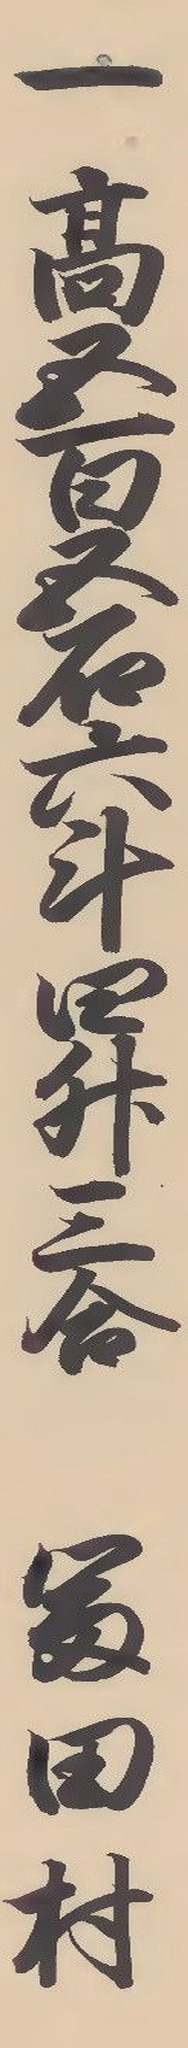一高五百五石六斗四升三合富田村
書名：信濃国郷帳
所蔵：国立公文書館 National Archives of Japan
